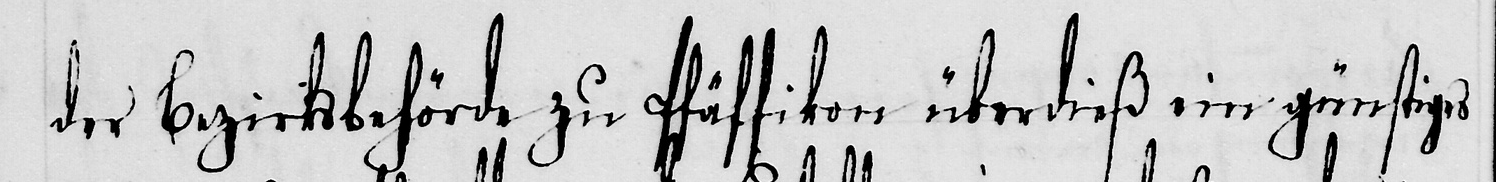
der Bezirksbehörde zu Pfäffikon überdieß ein günstiges
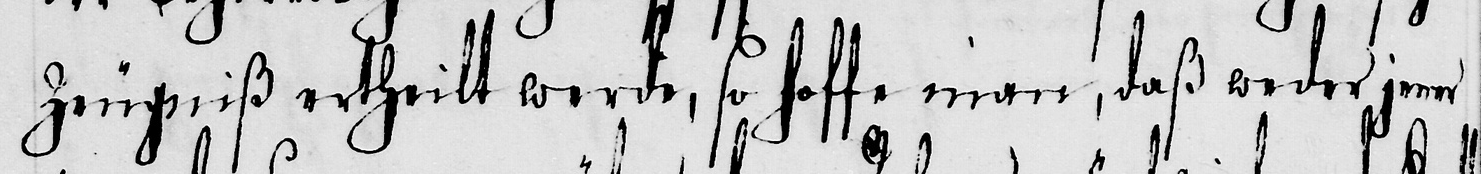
Zeugniß ertheilt werde, so hoffe man, daß weder jener
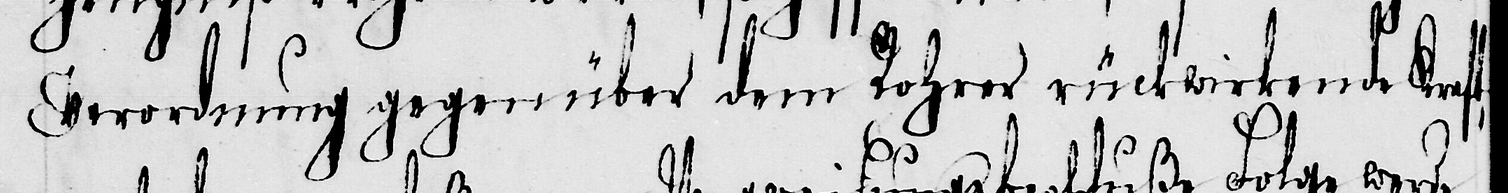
Verordnung gegenüber dem Rohrer rückwirkende Kraf¬
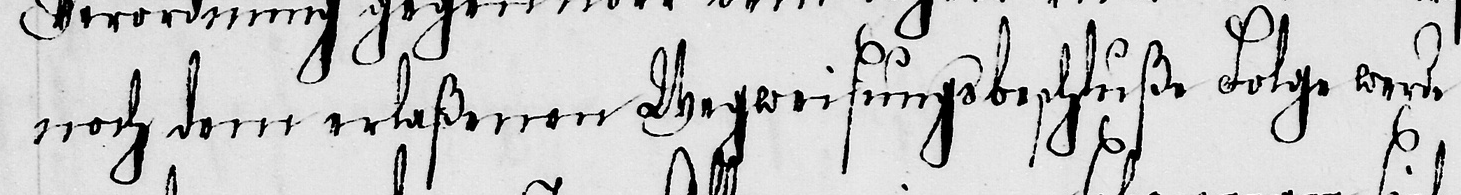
noch dem erlassenen Wegweisungsbeschlusse Folge werde
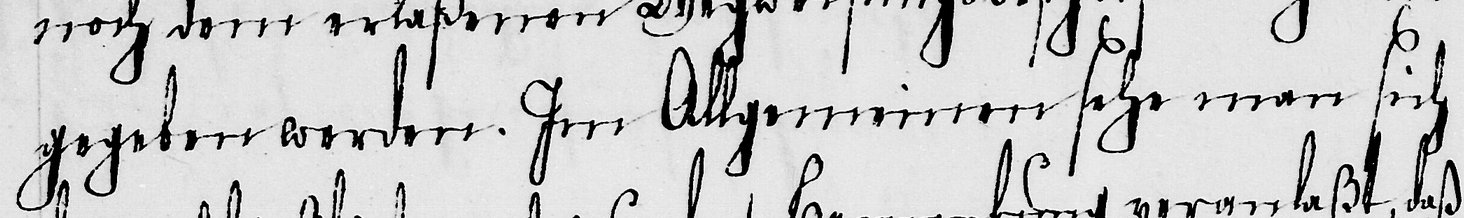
gegeben werden. Im Allgemeinen sehe man sich
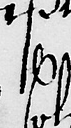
t,
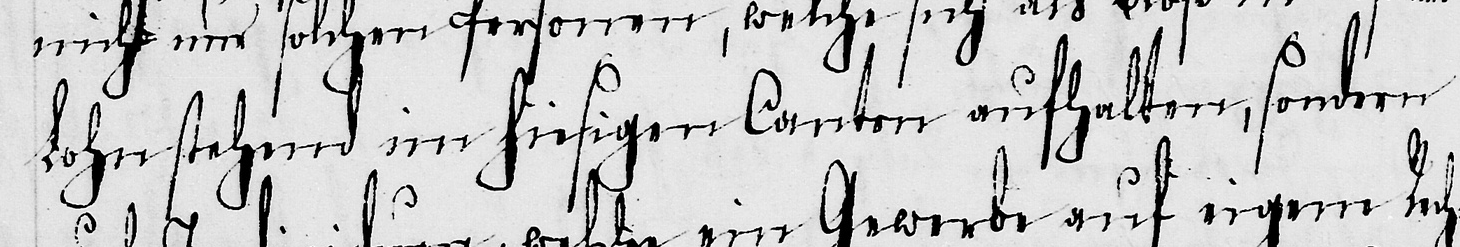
Lohn stehend im hiesigen Canton aufhalten, sondern
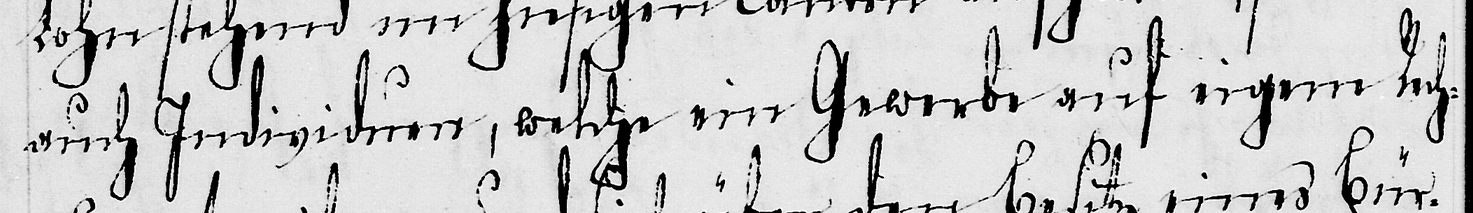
auch Individuen, welche ein Gewerbe auf eigene Rech¬
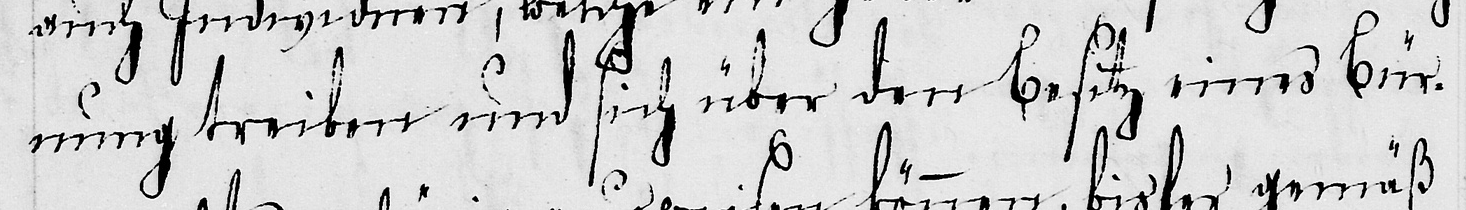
nung treiben und sich über den Besitz eines Bür¬
